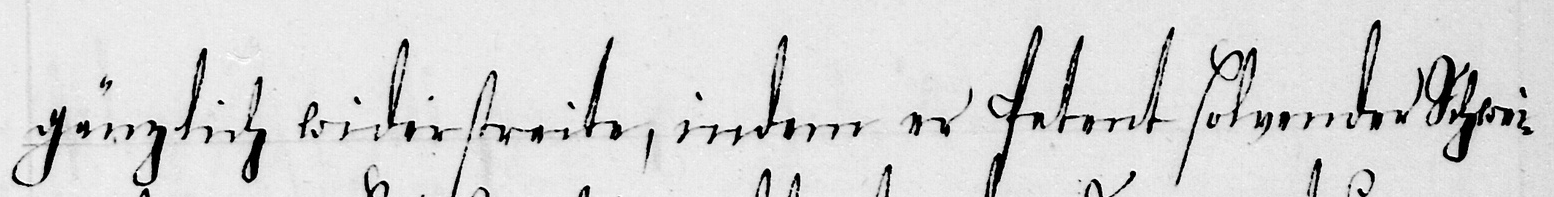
gänzlich widerstreite, indem er Petent solvender Schwe¬
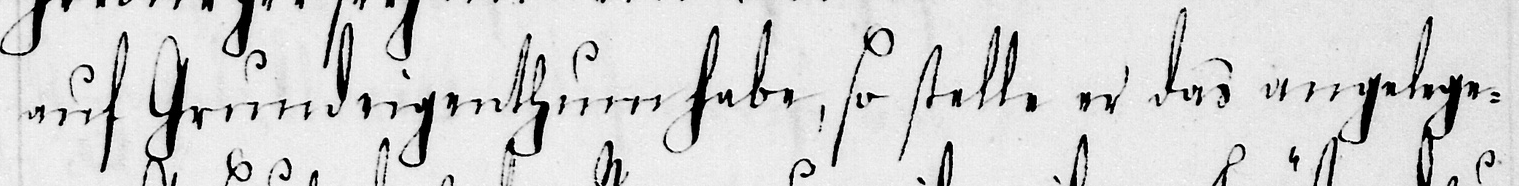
auf Grundeigenthum habe, so stelle er das angelege¬
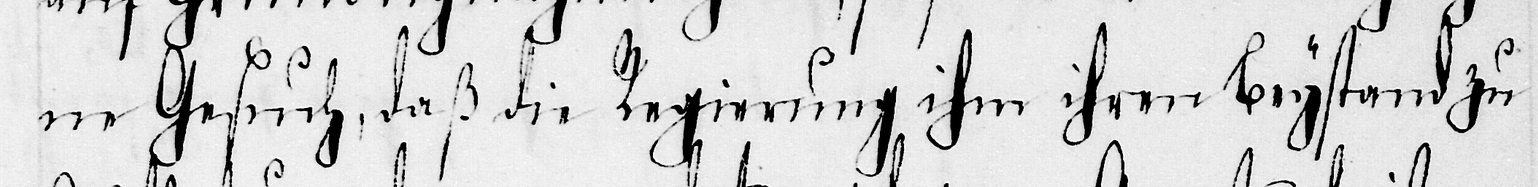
ne Gesuch, daß die Regierung ihm ihren Beystand zu
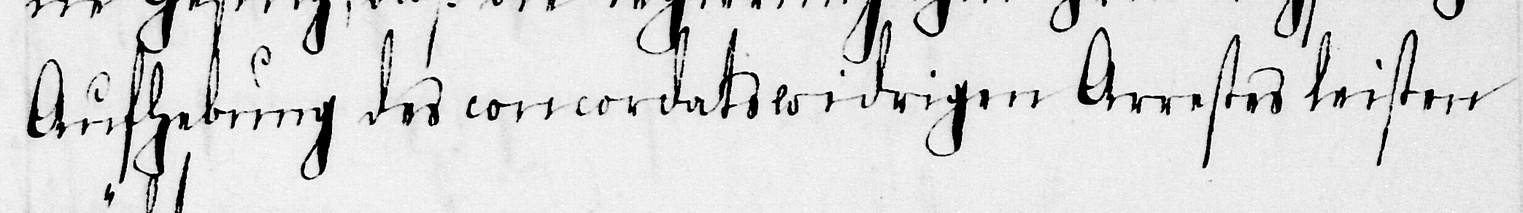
Aufhebung des concordatswidrigen Arrestes leisten
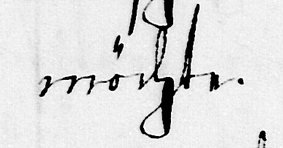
möchte.
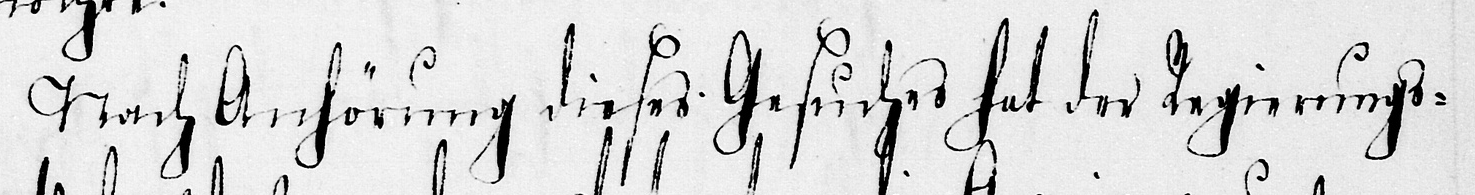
Nach Anhörung dieses Gesuches hat der Regierungs¬
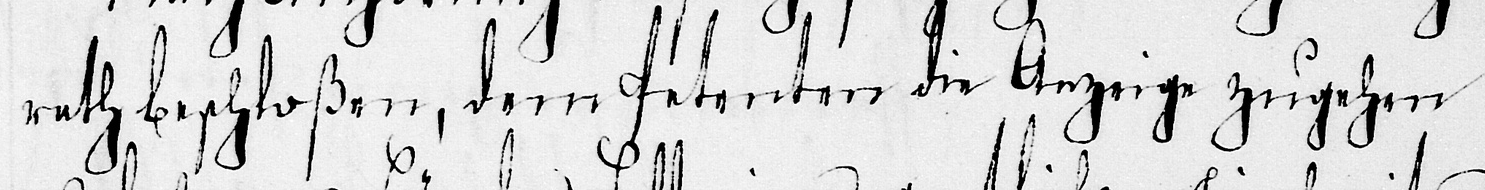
rath beschloßen, dem Petenten die Anzeige zugehen
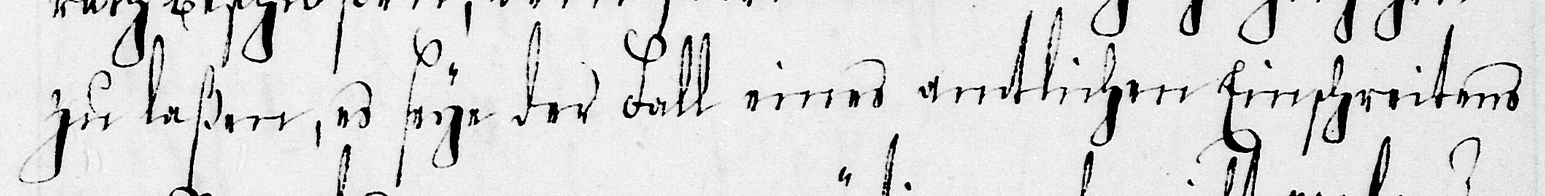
zu laßen, es seye der Fall eines amtlichen Einschreitens
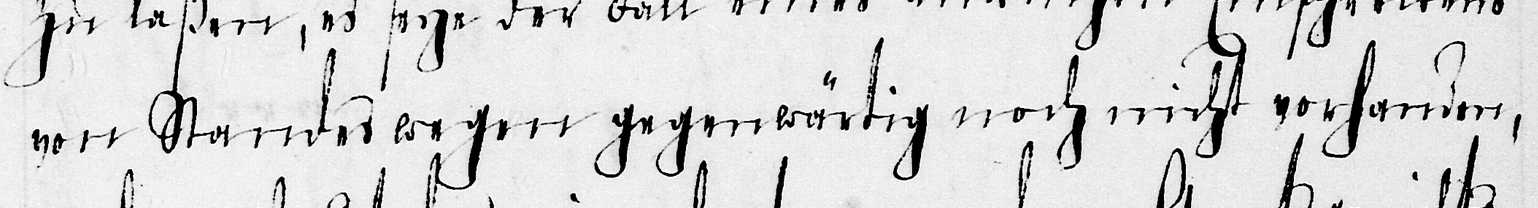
von Standes wegen gegenwärtig noch nicht vorhanden,
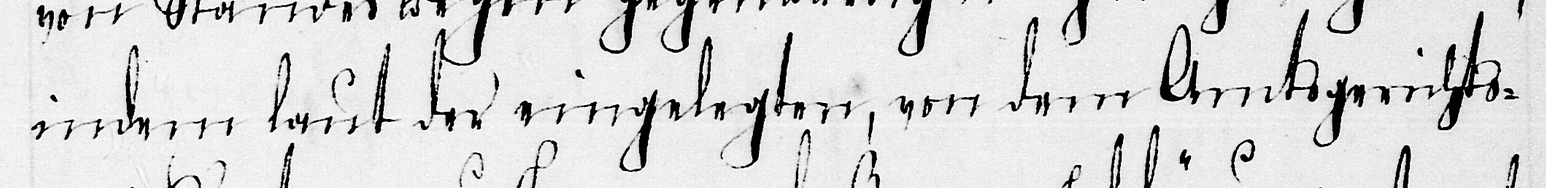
indem laut der eingelegten, von dem Amtsgerichts¬
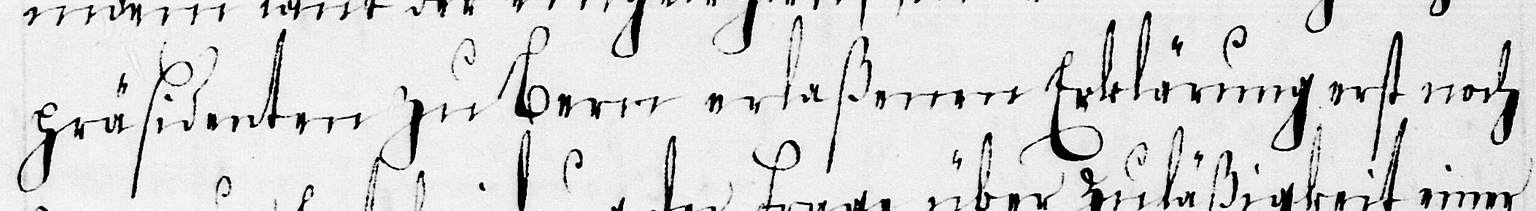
präsidenten zu Bern erlaßenen Erklärung erst noch
